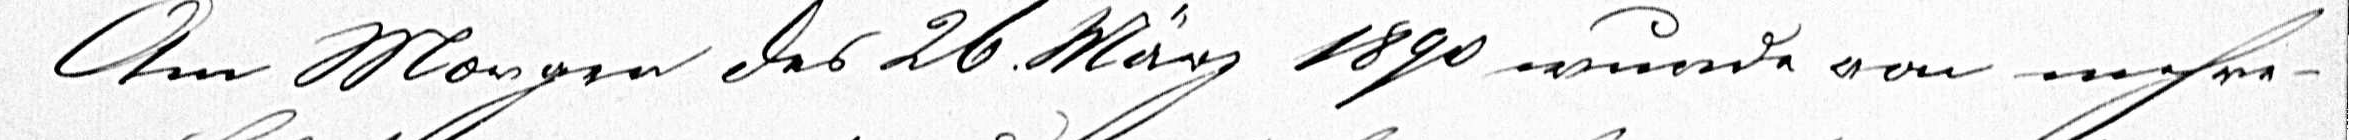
Am Morgen des 26. März 1890 wurde von mehre¬
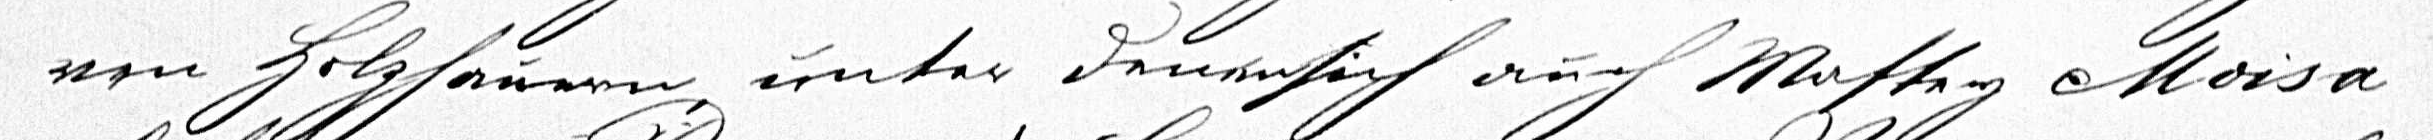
ren Holzhauern unter denen sich auch Maftey Moisa
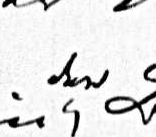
der
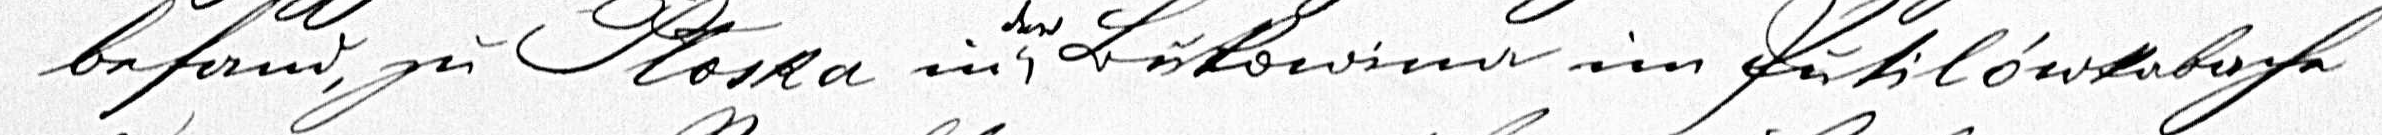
befand, zu Płoska in Bukowina im Putilówkabache
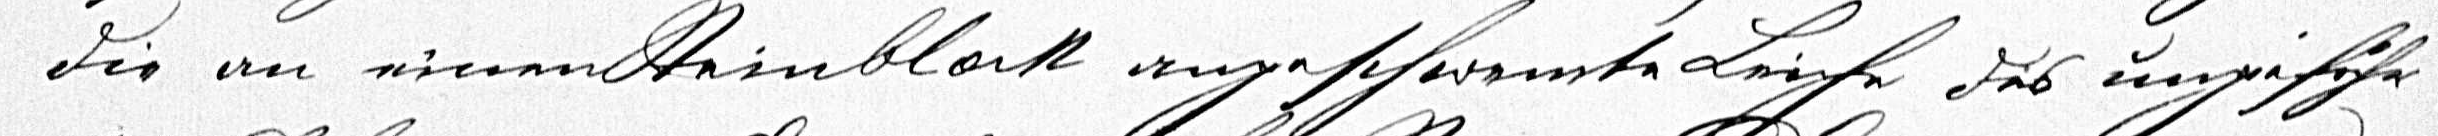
die an einen Steinblock angeschwemte Leiche des ungefähr
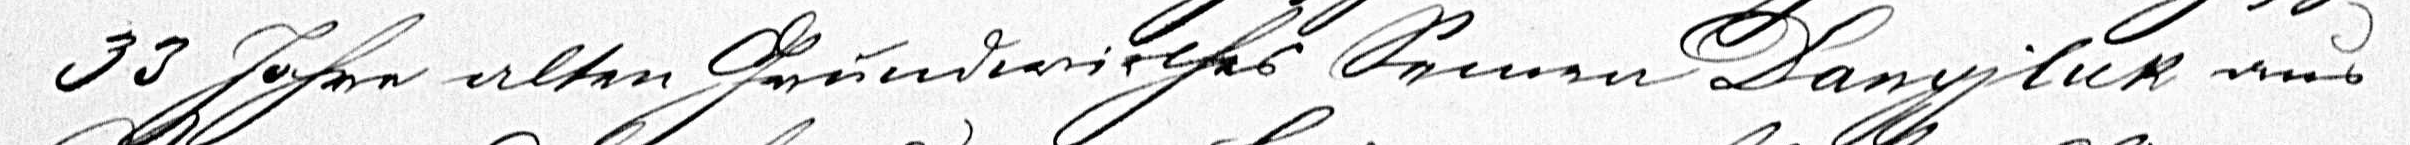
33 Jahre alten Grundwirthes Semen Danyjluk aus
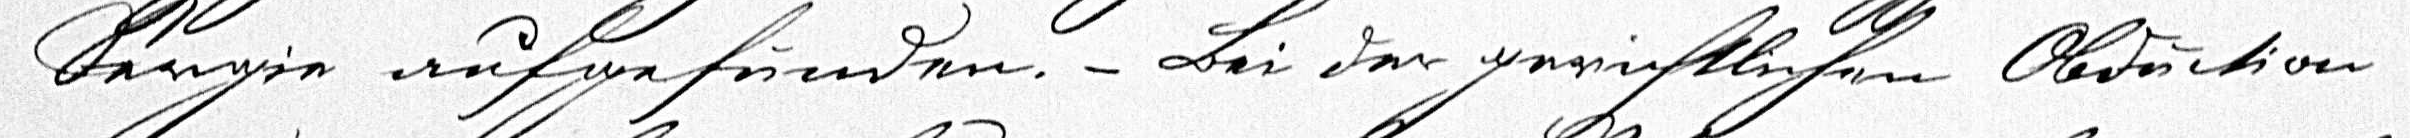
Sergie aufgefunden. Bei der gerichtlichen Obduction
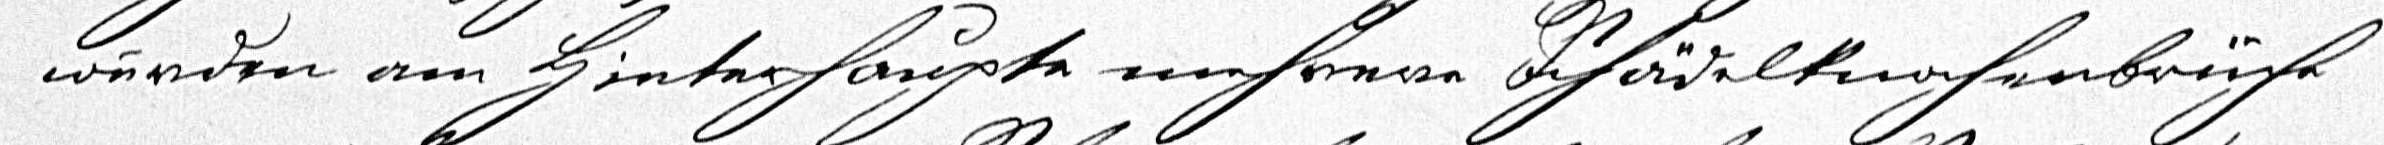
wurden am Hinterhaupte mehrere Schädelknochenbrüche
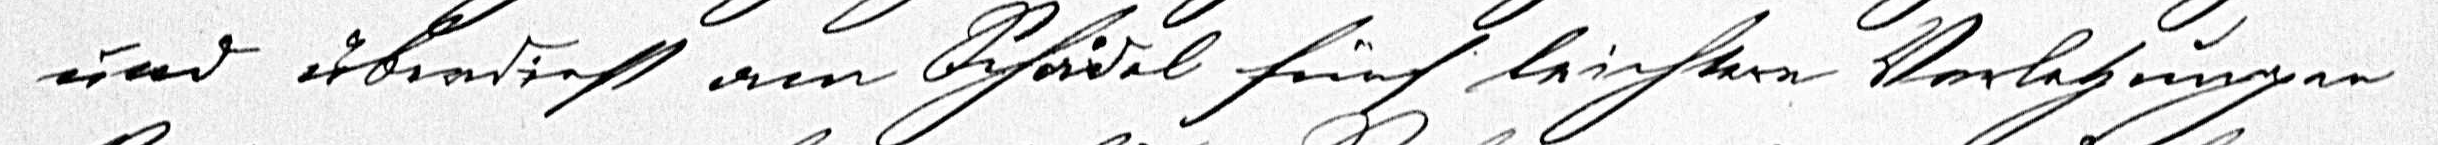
und überdieß am Schädel fünf leichtere Verletzungen
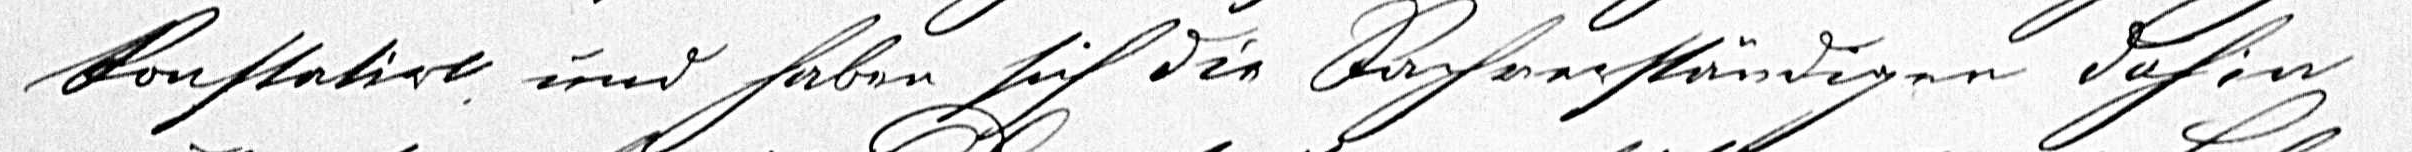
konstatirt und haben sich die Sachverständigen dahin
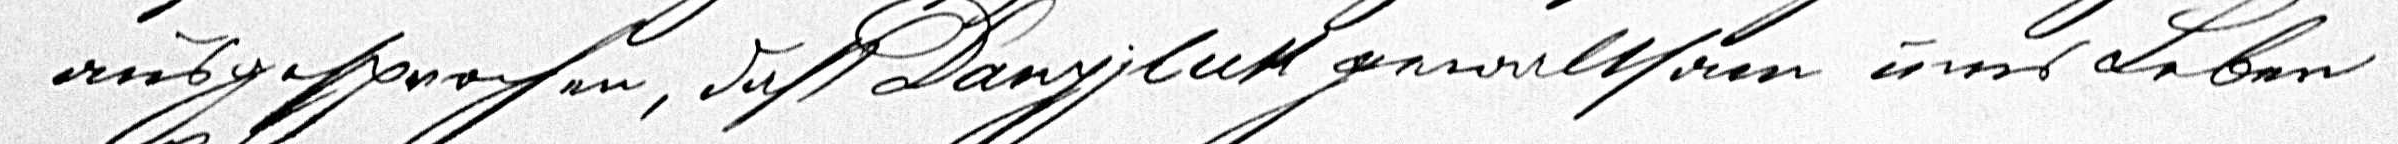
ausgesprochen, daß Danyjluk gewaltsam ums Leben
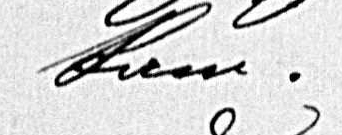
kam.
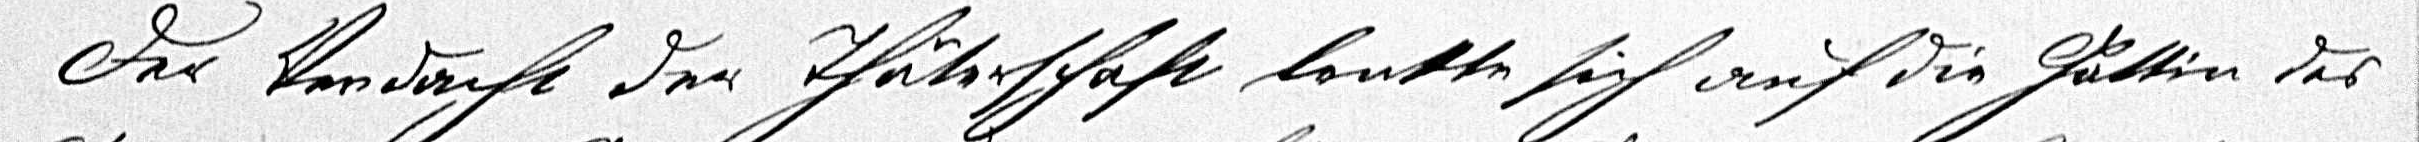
Der Verdacht der Thäterschaft lenkte sich auf die Gattin des
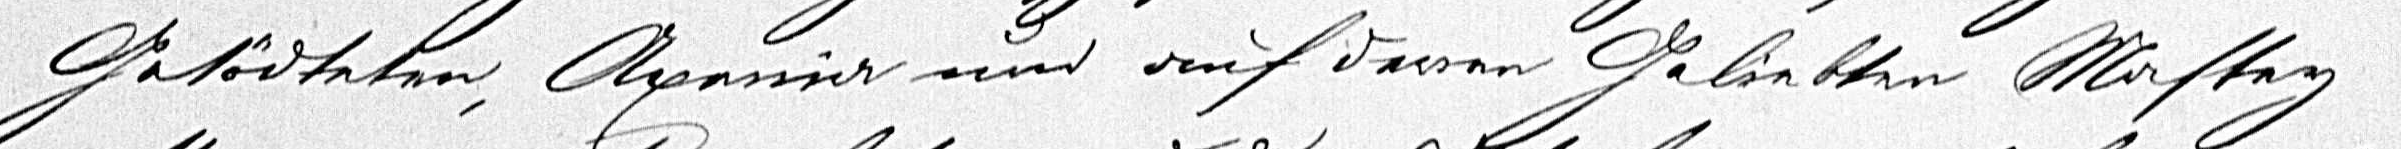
Getödteten, Axenia und auf deren Geliebten Maftey
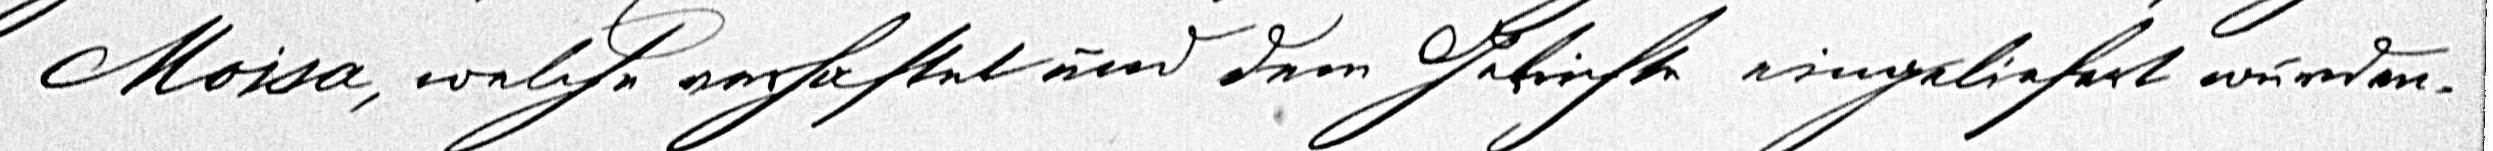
Moisa, welche verhaftet und dem Gerichte eingeliefert wurden.
